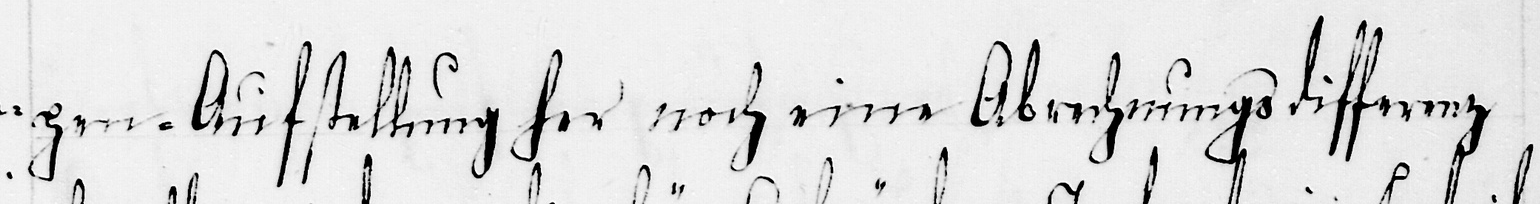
pen-Aufstellung her noch eine Abrechnungsdifferenz
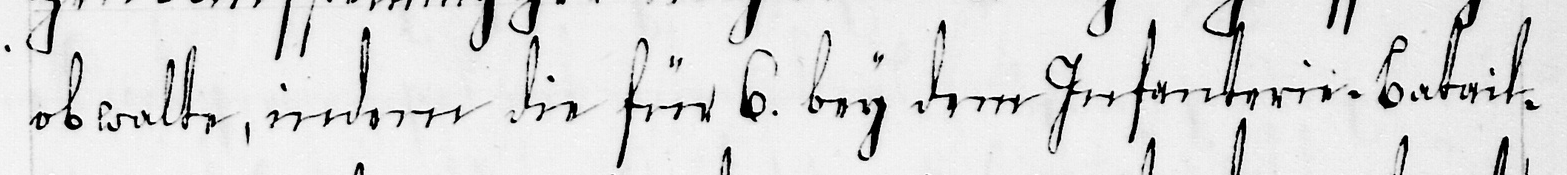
obwalte, indem die für 6. bey dem Infanterie-Batail¬
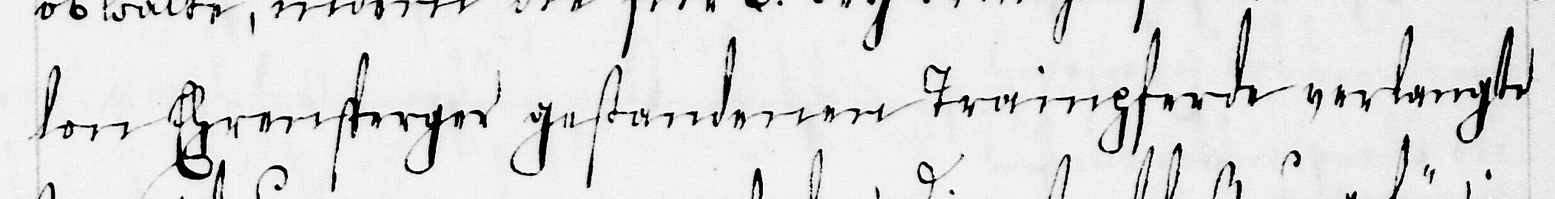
lon Ehrensperger gestandenen Trainpferde verlangte
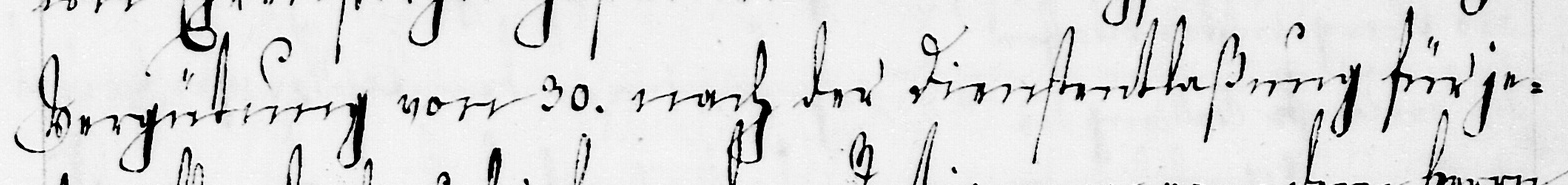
Vergütung von 30. nach der Dienstentlaßung für je¬
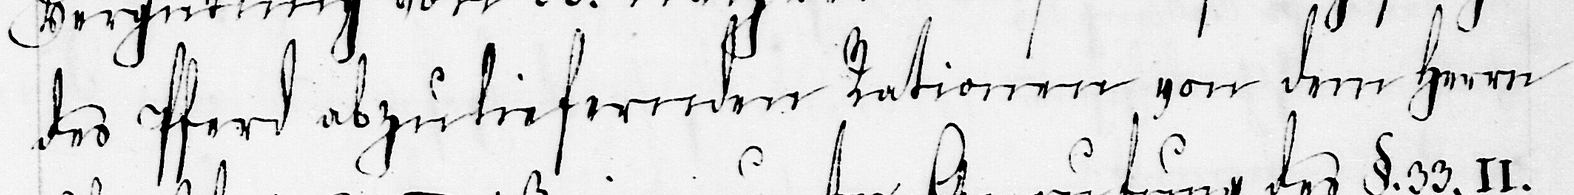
des Pferd abzuliefernden Rationen von dem Herrn
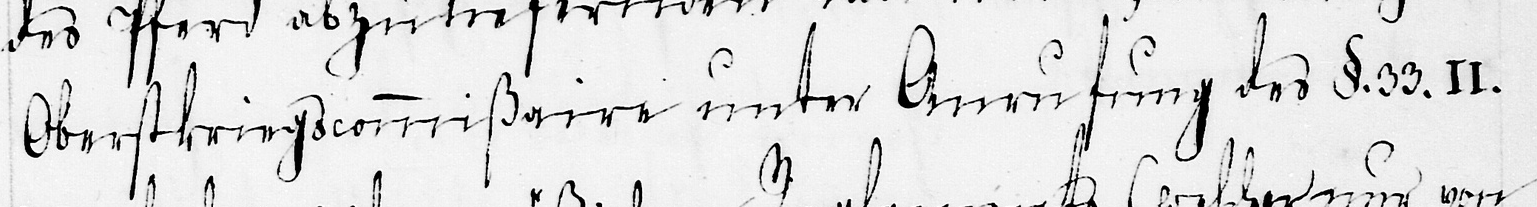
Oberstkriegscommißaire unter Anrufung des §. 33. II.
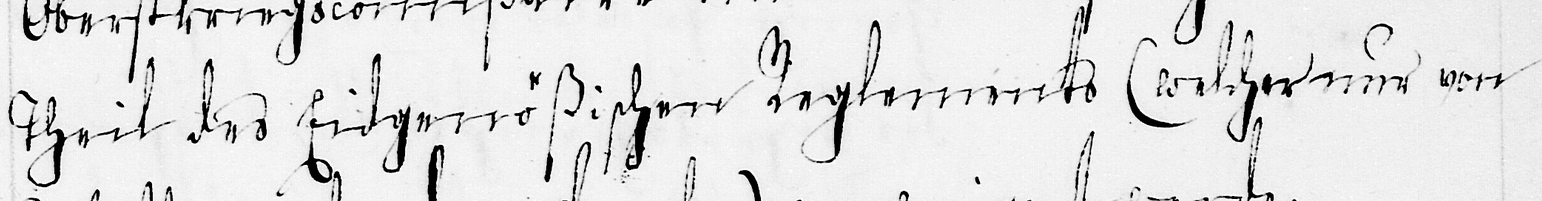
Theil des Eidgenößischen Reglements (welcher nur von
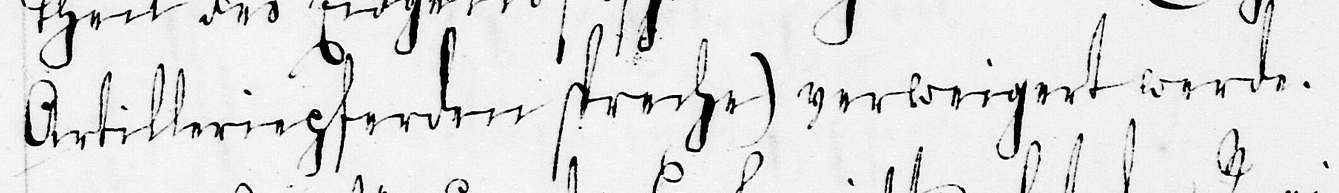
Artilleriepferden spreche) verweigert werde.
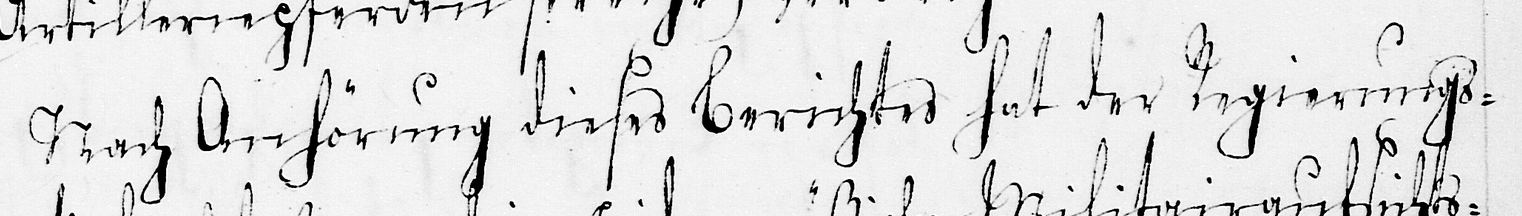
Nach Anhörung dieses Berichtes hat der Regierungs¬
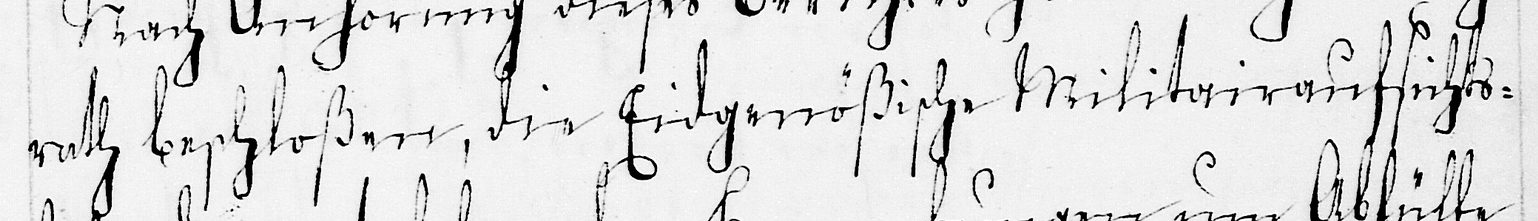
rath beschloßen, die Eidgenößische Militairaufsichts¬
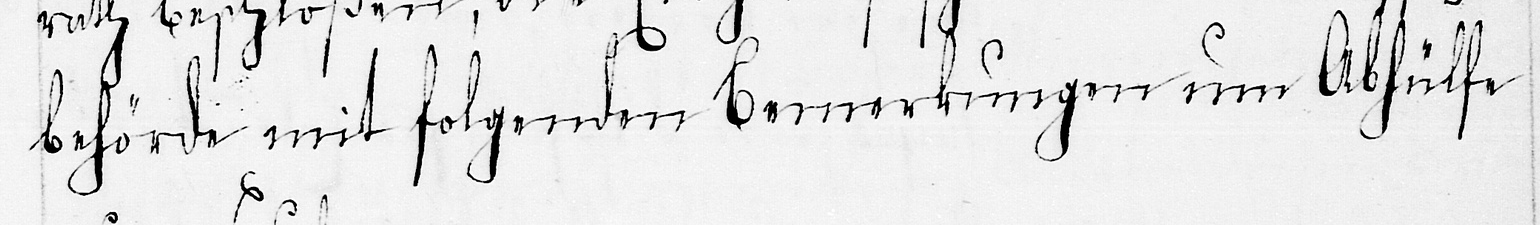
behörde mit folgenden Bemerkungen um Abhülfe
